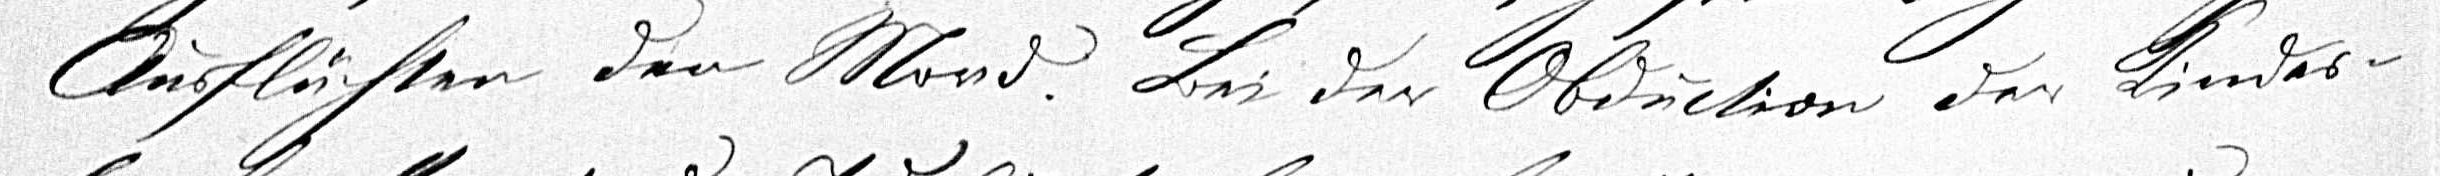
Ausfluchten den Mord. Bei der Obduction der Kindes¬
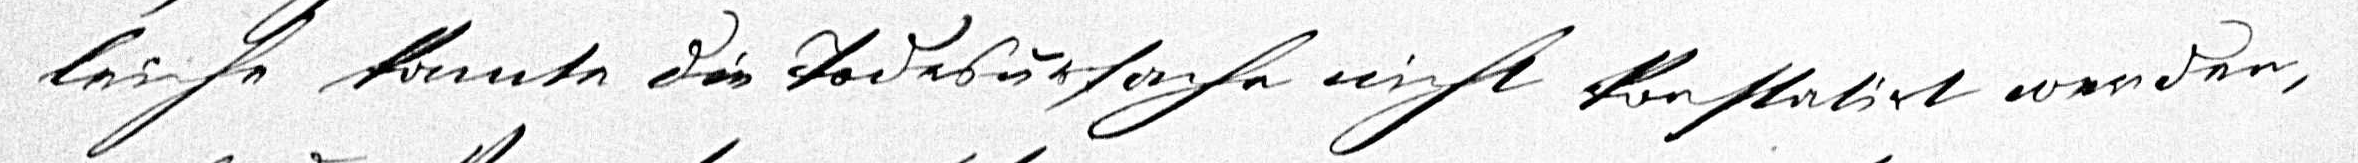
leiche konnte die Todesursache nicht konstatirt werden,
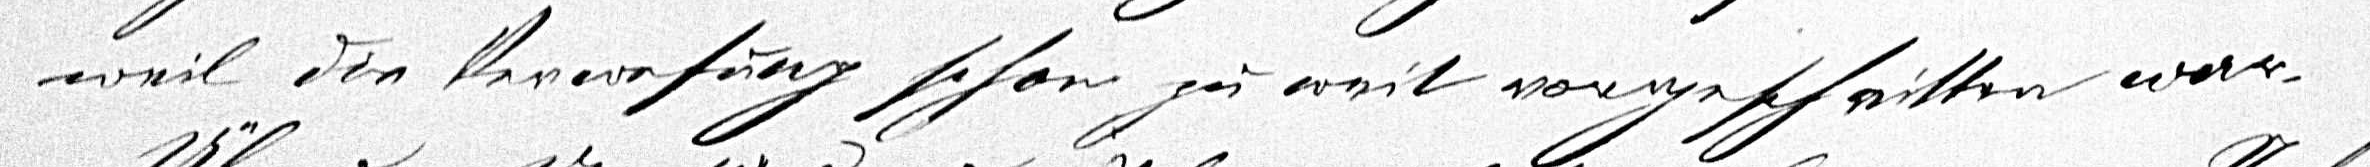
weil die Verwehung schon zu weit vorgeschritten war.
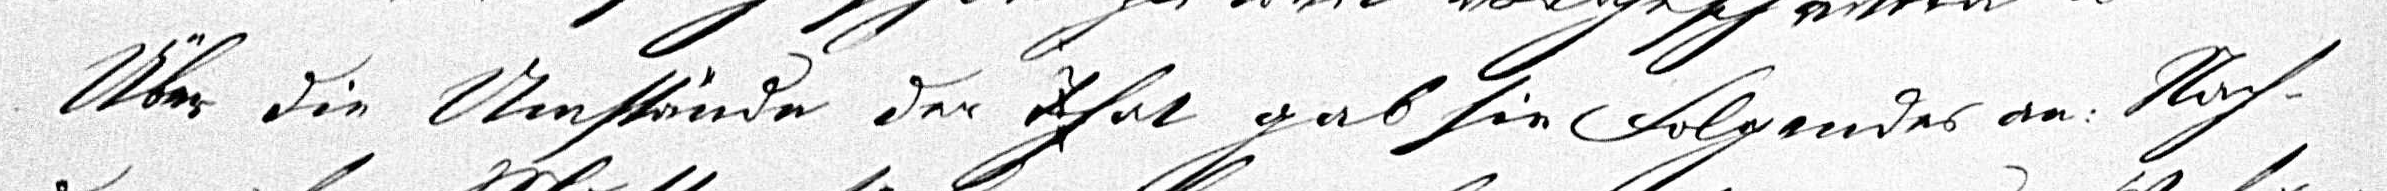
Über die Umstände der That gab sie Folgendes an: Nach¬
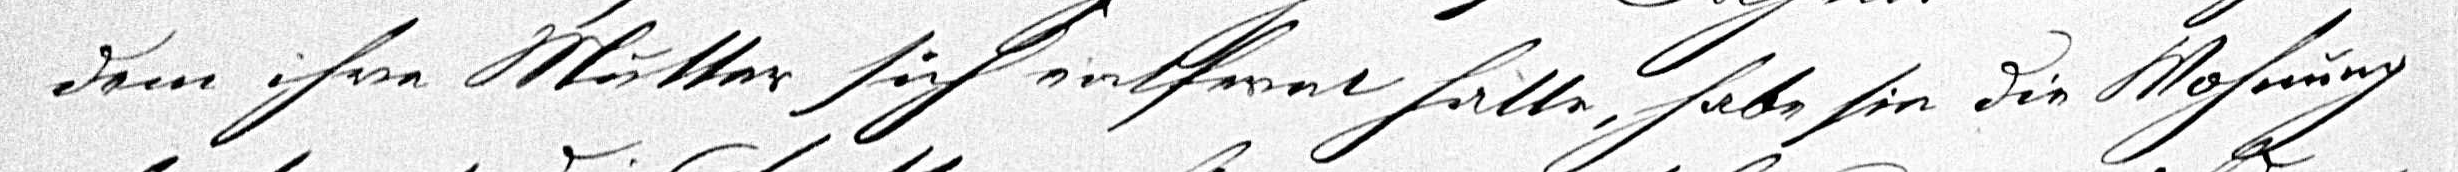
dem ihre Mutter sich entfernt hatte, habe sie die Wohnung
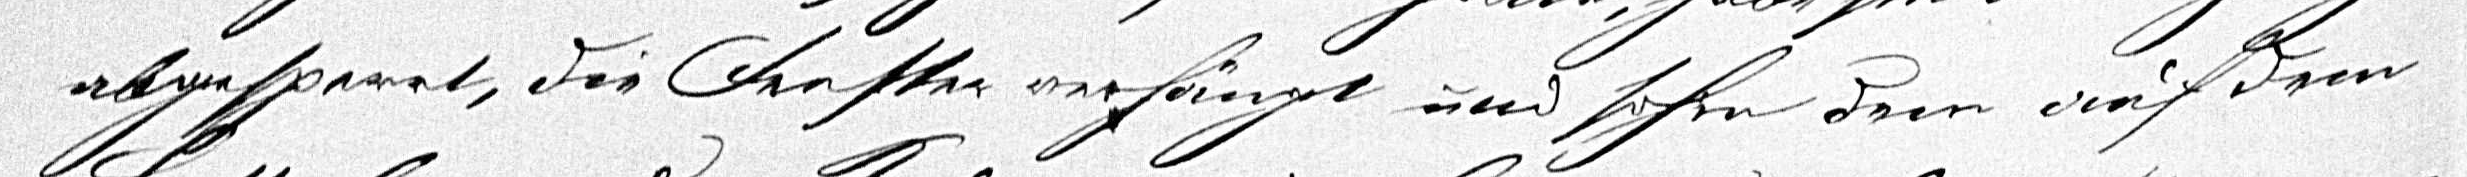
abgesperrt, die Fenster verhängt und sohin dem auf dem
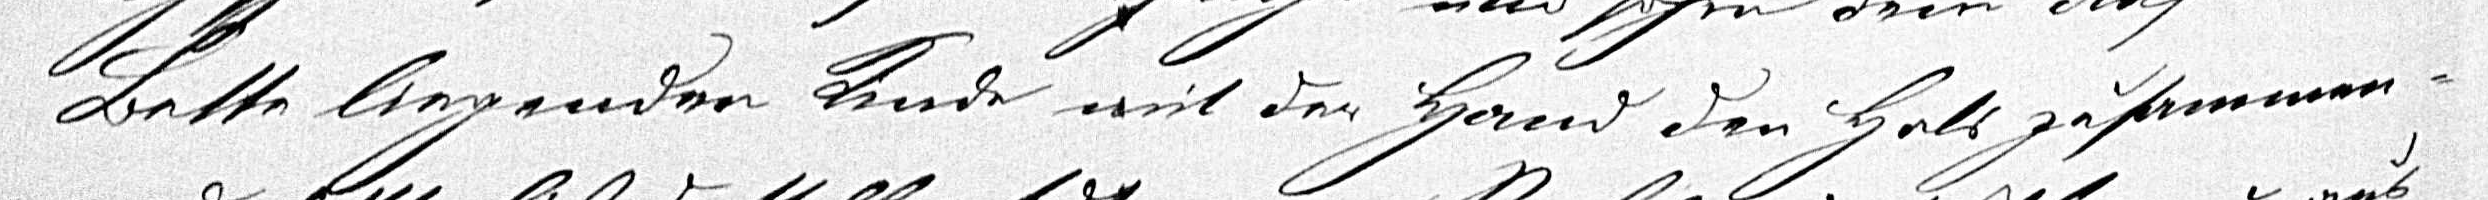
Bette liegenden Kinde mit der Hand den Hals zusammen¬
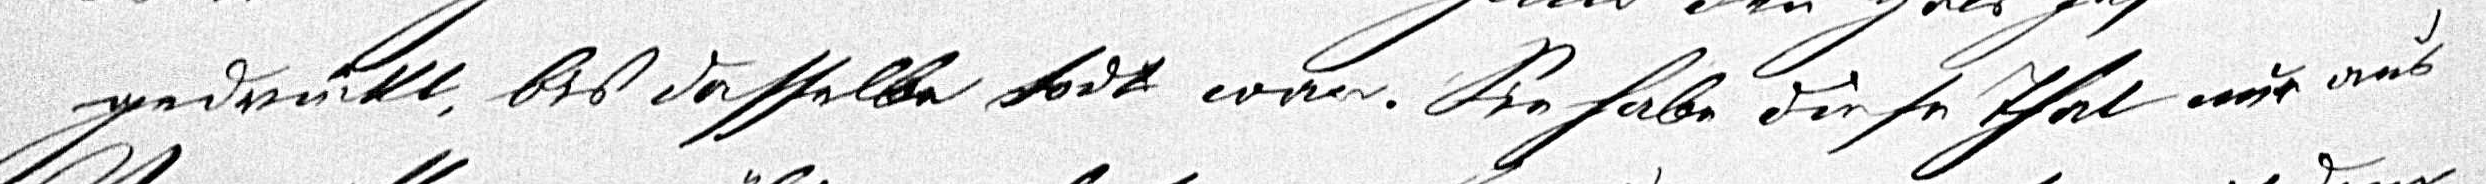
gedrückt, bis dasselbe todt war. Sie habe diese That nur aus
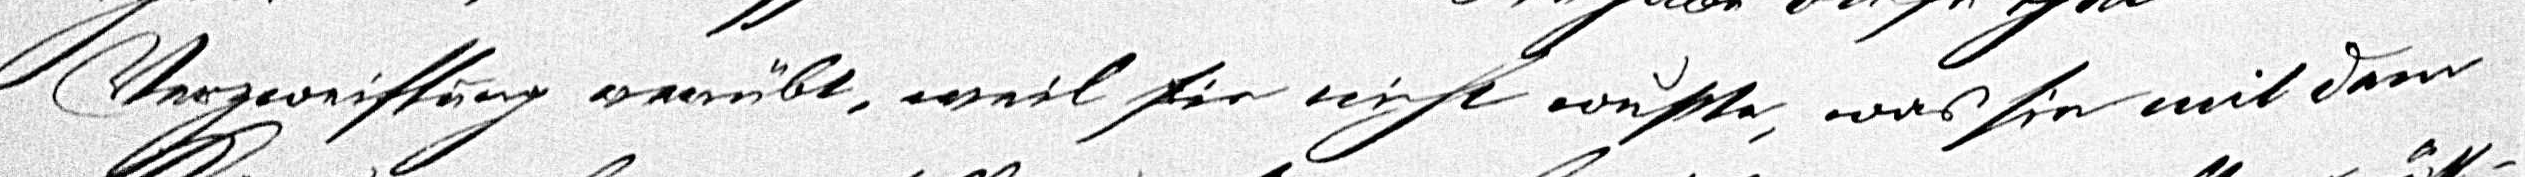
Verzweiflung verübt, weil sie nicht wußte, was sie mit dem
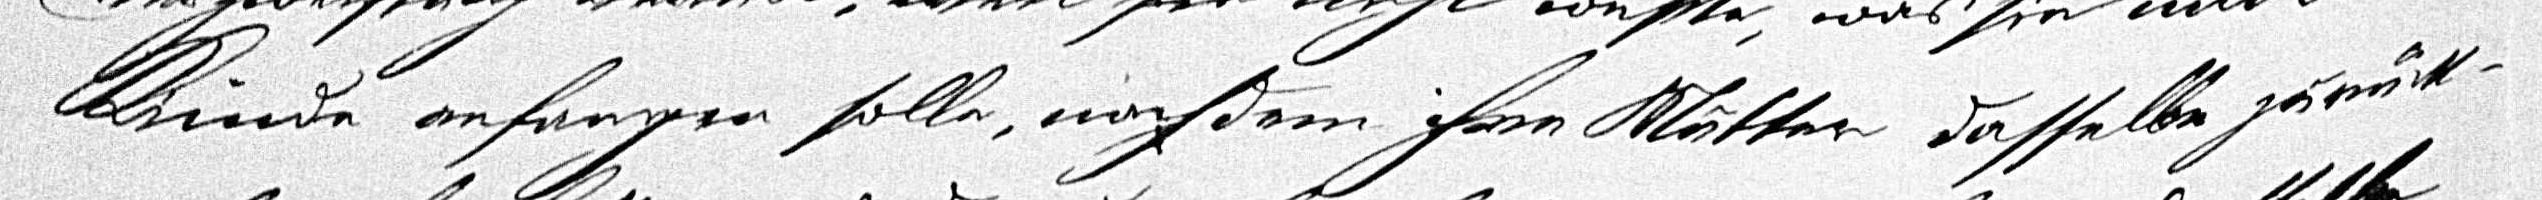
Kinde anfangen solle, nachdem ihre Mutter dasselbe zurück¬
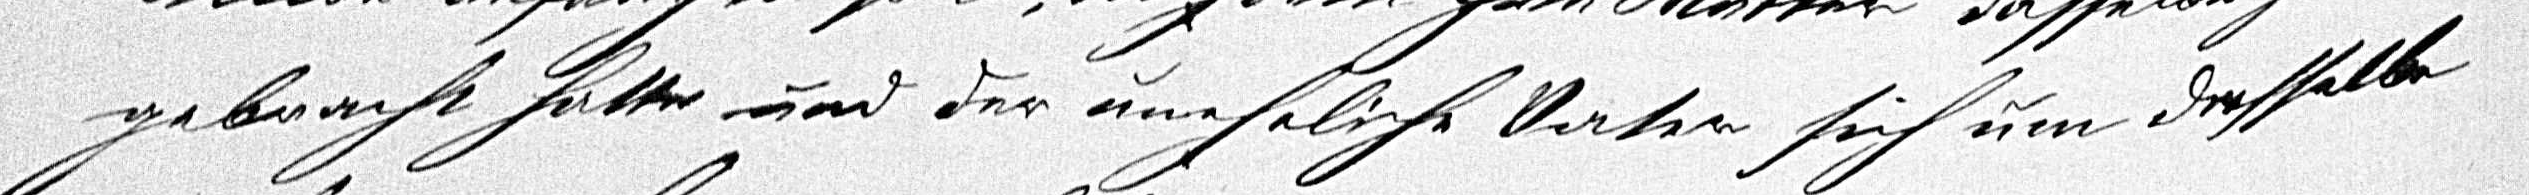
gebracht hatte und der uneheliche Vater sich um dasselbe
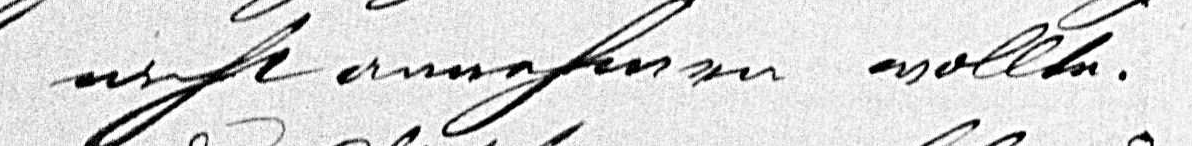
nicht annehmen wollte.
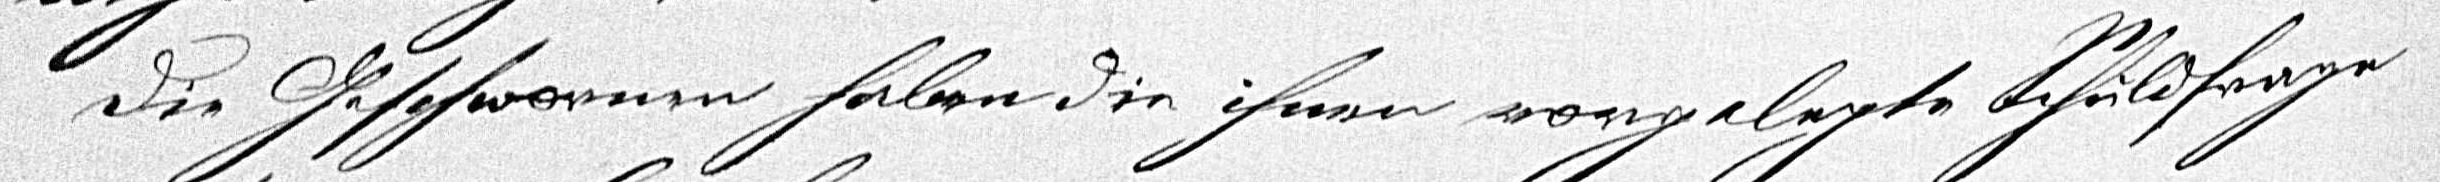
Die Geschwornen haben die ihnen vorgelegte Schuldfrage
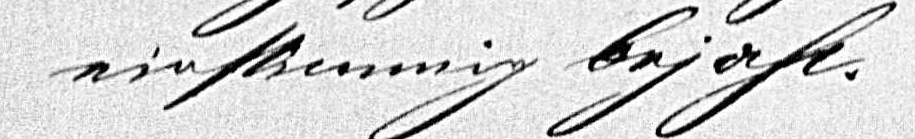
einstimmig bejaht.
